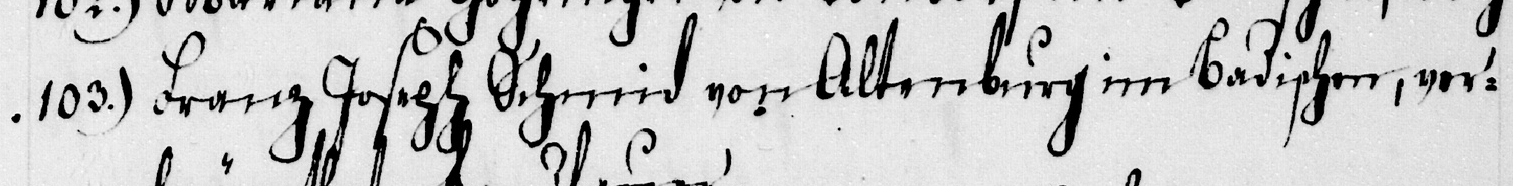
103.) Franz Joseph Schmid von Altenburg im Badischen, ver¬
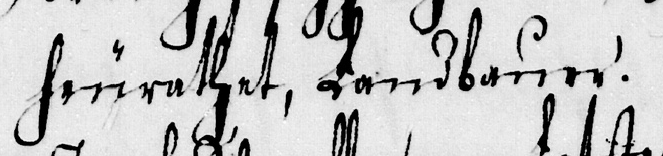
heurathet, Landbauer.
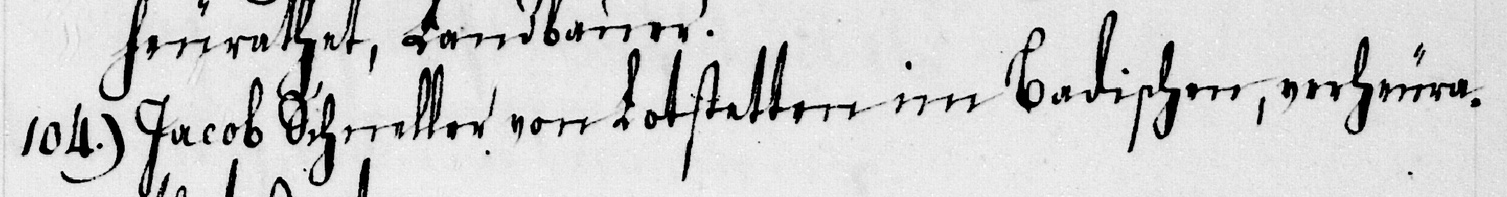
104.) Jacob Schneller von Lotstetten im Badischen, verheura¬
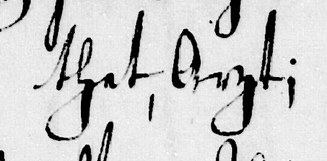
thet, Arzt;
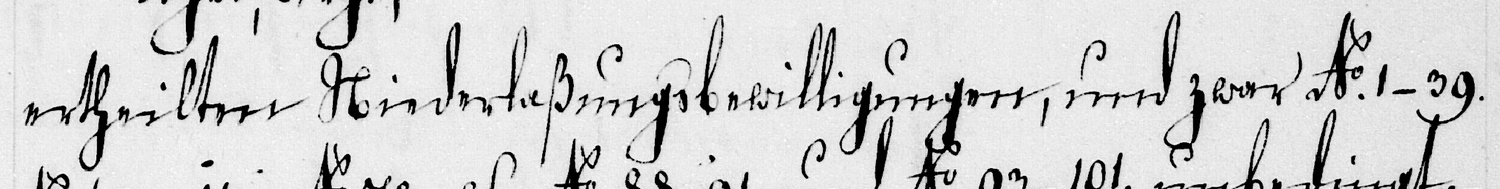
ertheilten Niederlaßungsbewilligungen, und zwar No. 1–39.
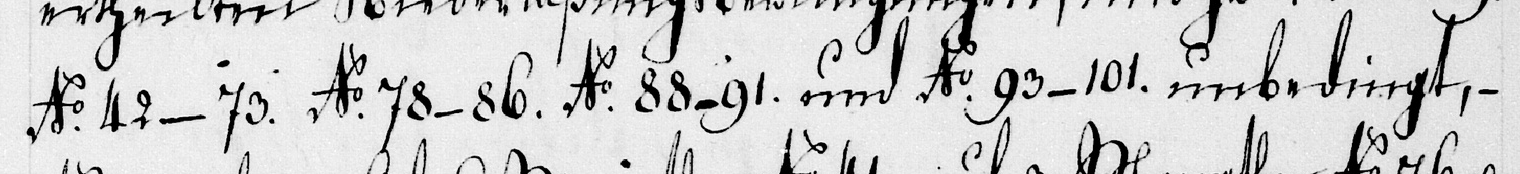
No. 42–73 No. 78–86 No. 88–91. und No. 93–101 unbedingt,–
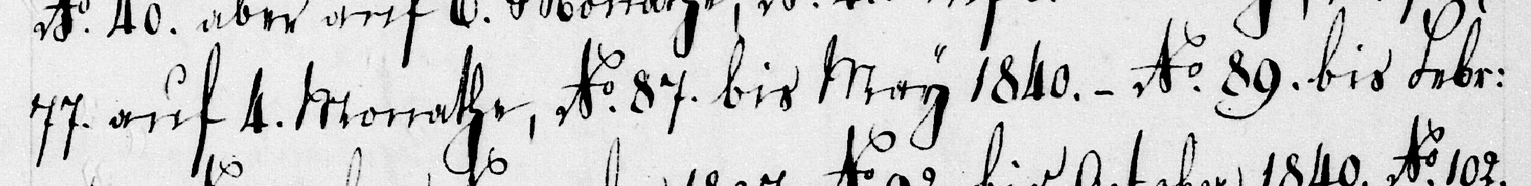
77. auf 4. Monathe, No. 87. bis März 1840.– No. 89. bis Febr:
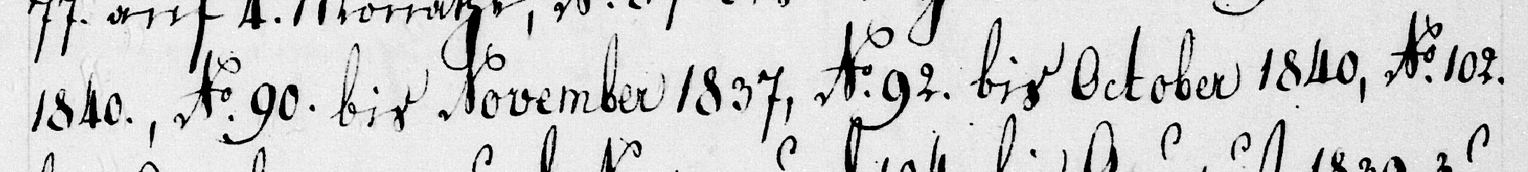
1840., No. 90. bis November 1837, No. 92. bis October 1840, No. 102.
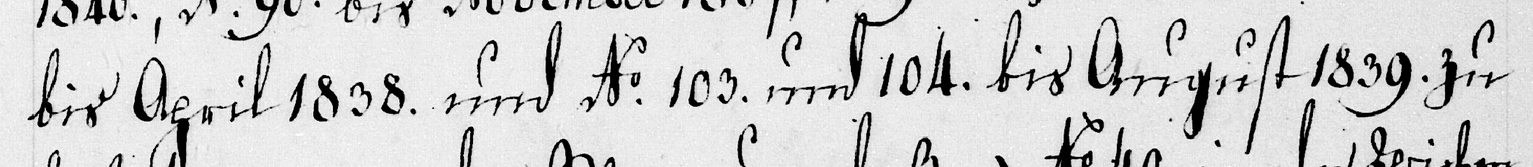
bis April 1838. und No. 103. und 104. bis August 1839. zu
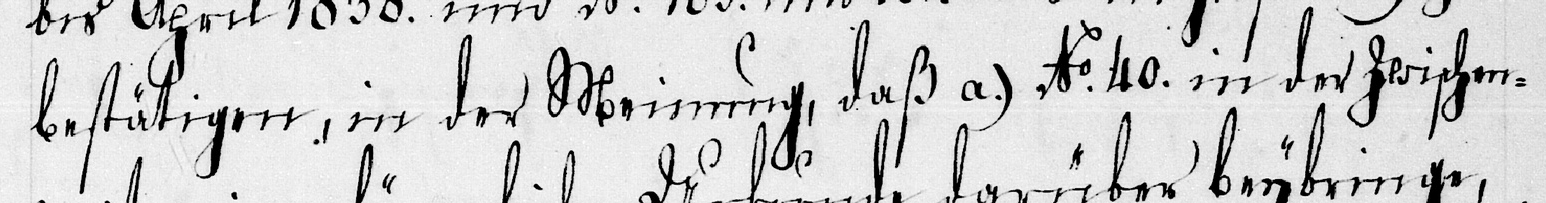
bestätigen, in der Meinung, daß a.) No. 40. in der Zwischen¬
